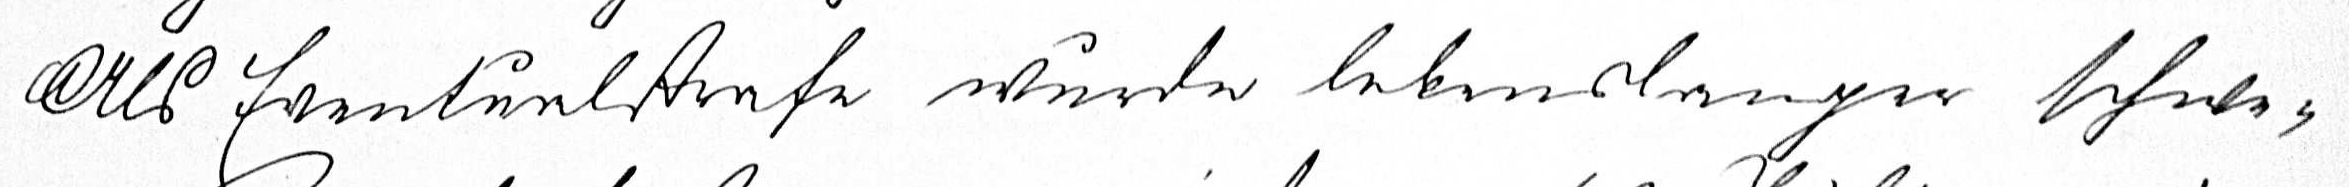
Als Eventuelstrafe wurde lebenslanger schwe¬
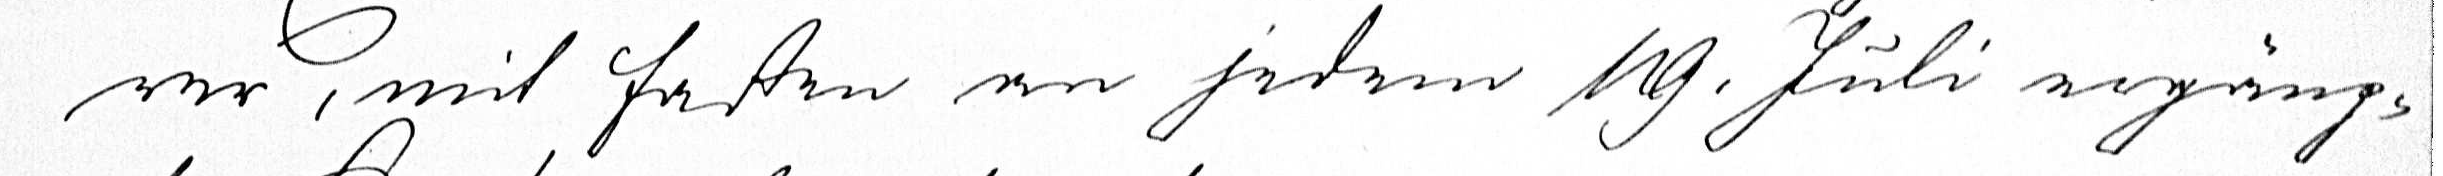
rer, mit Fasten an jeden 19. Juli ergän¬
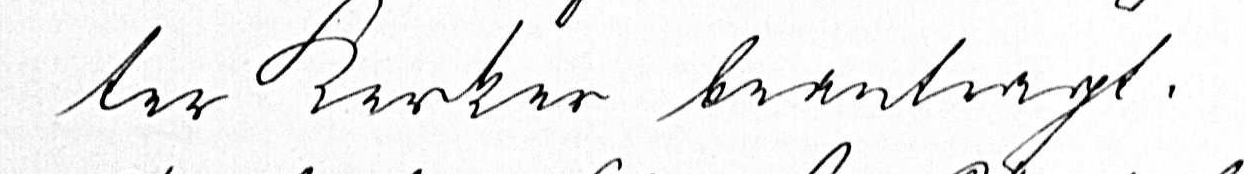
zter Kerker beantragt.
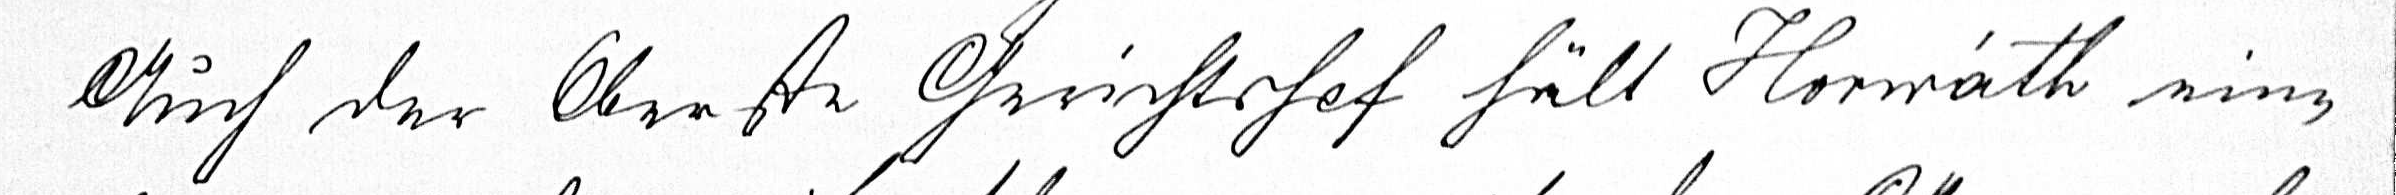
Auch der Oberste Gerichtshof hält Horwáth ein¬
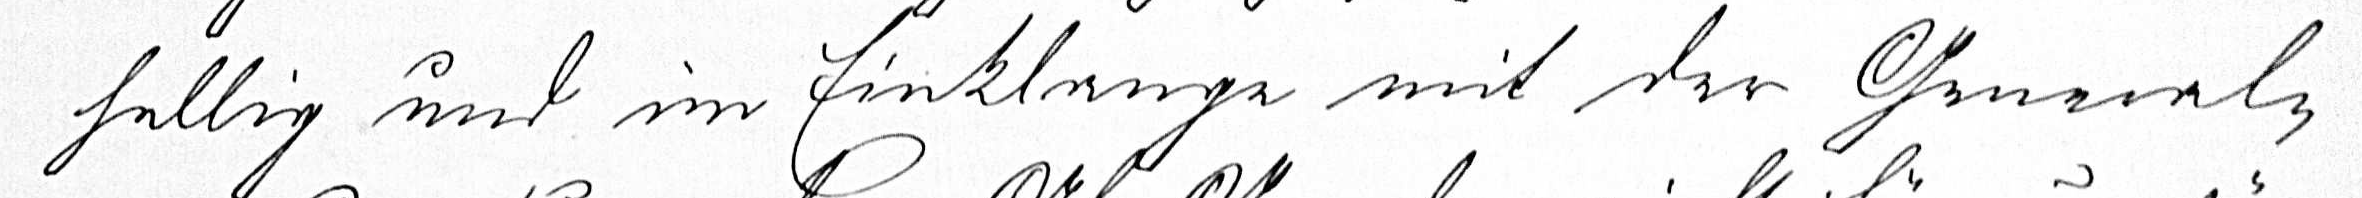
hellig und im Einklange mit der General¬
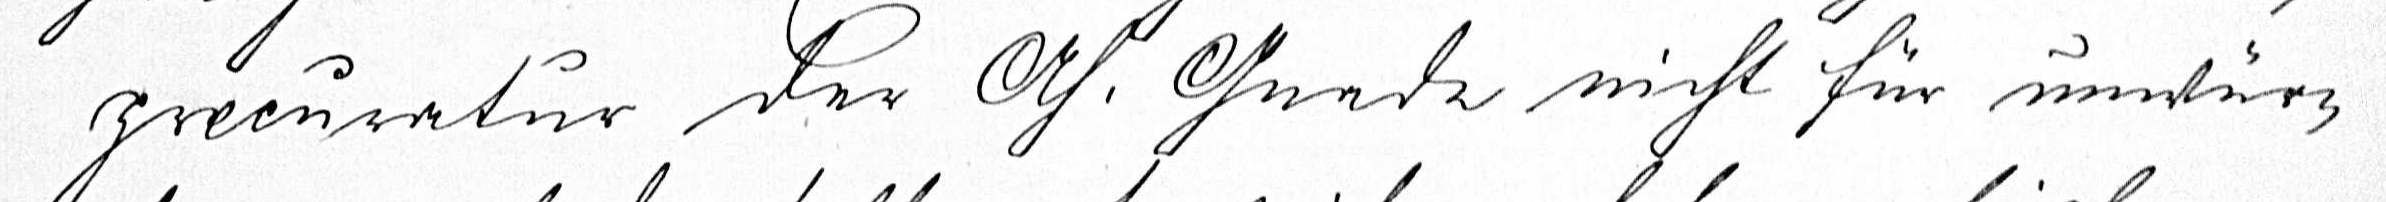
procurator der Ah. Gnade nicht für unwür¬
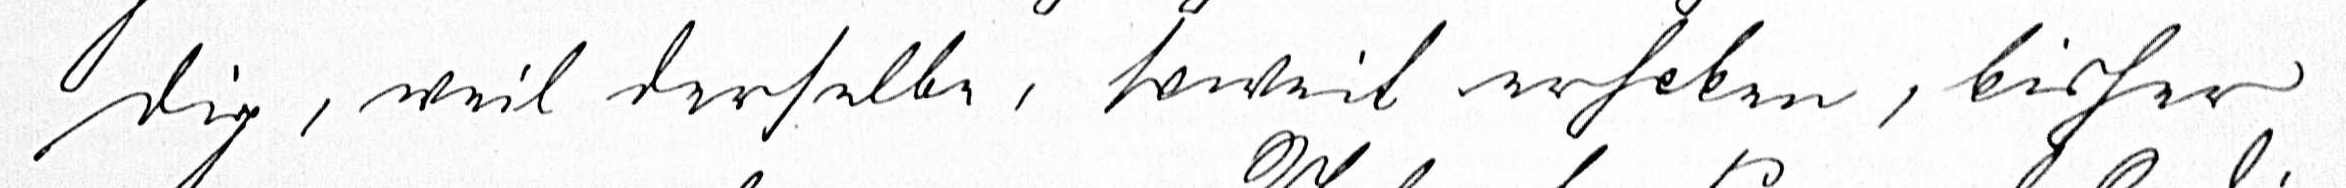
dig, wel derselbe, soweit erheben, bisher
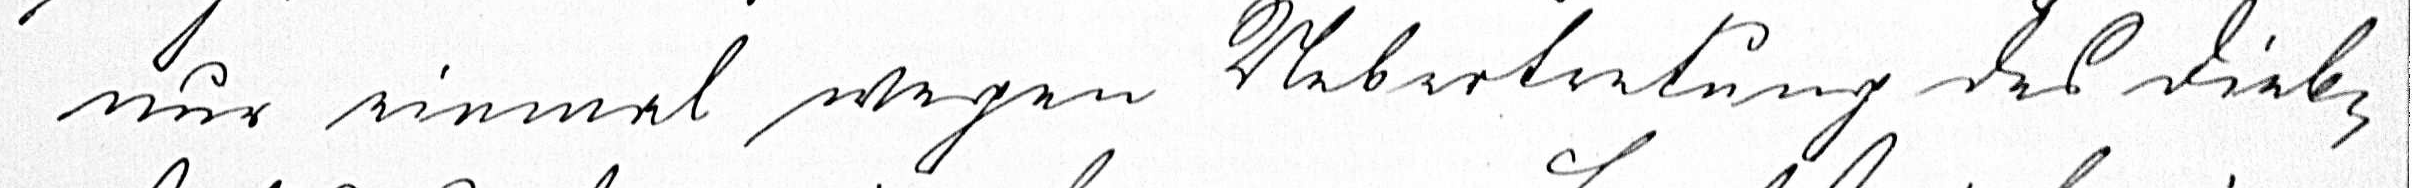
nur einmal wegen Uebertretung des Dieb¬
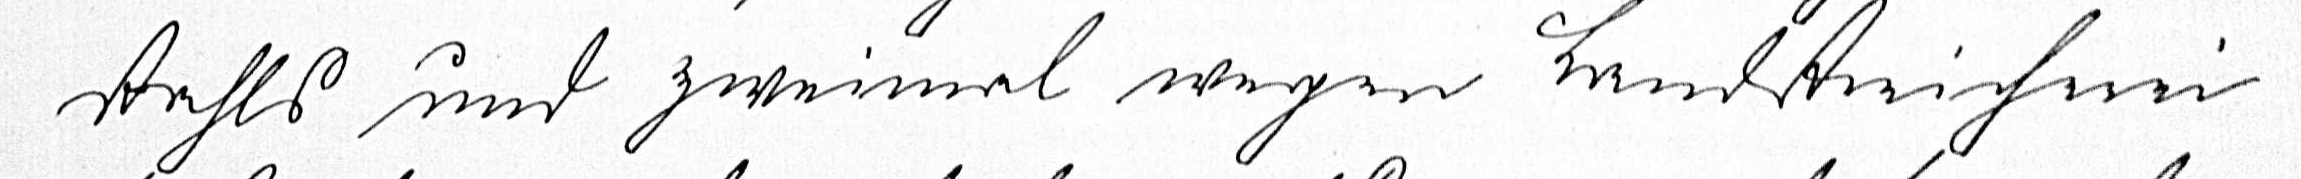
stahls und zweimal wegen Landstreicherei
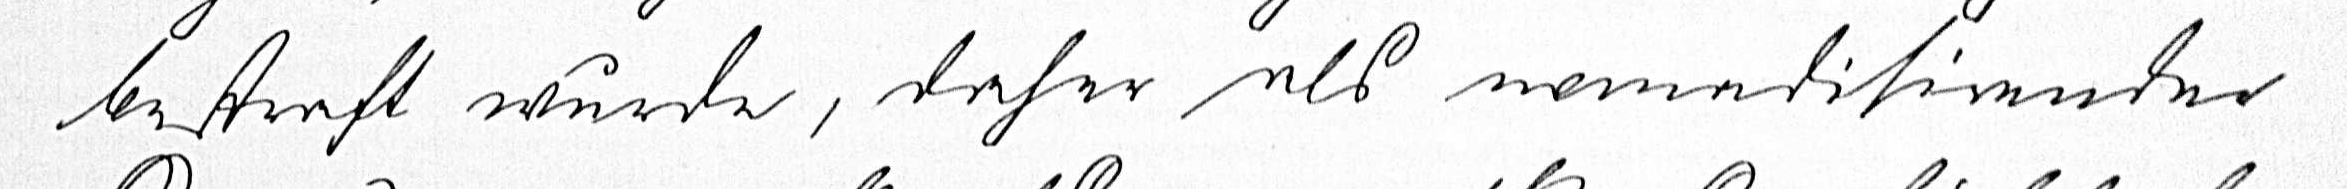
bestraft wurde, daher als nomadisirnder
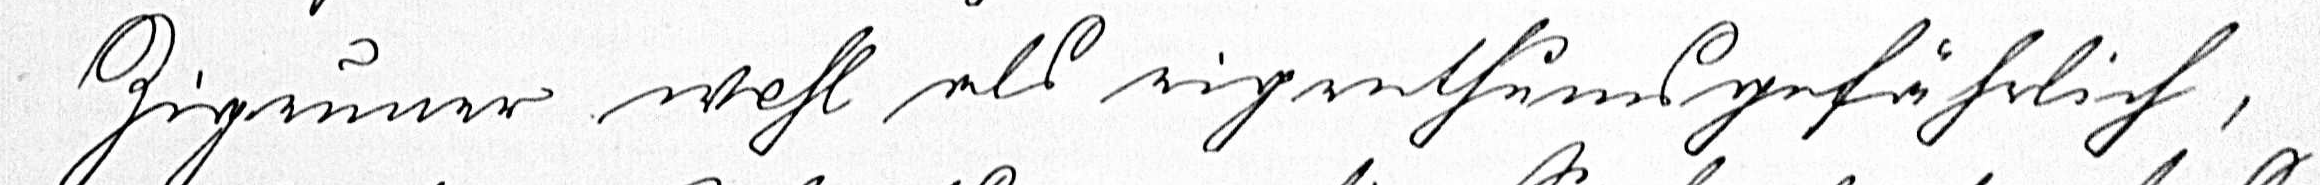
Zigeuner wohl als eingethumsgefährlich,
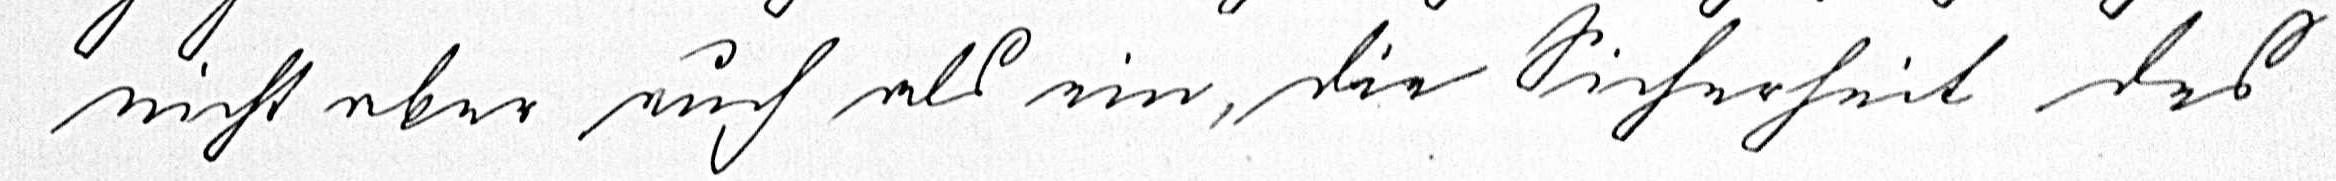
nicht eben auch als ein, die Sicherheit des
